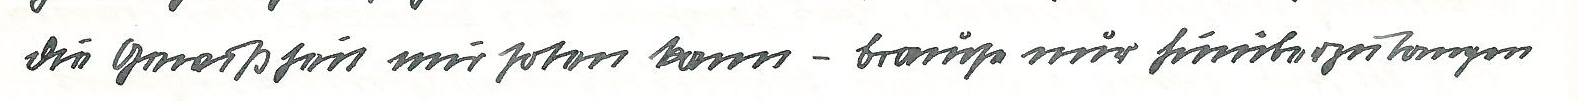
die Gewißheit mir holen kann – brauche nur hinüberzulangen
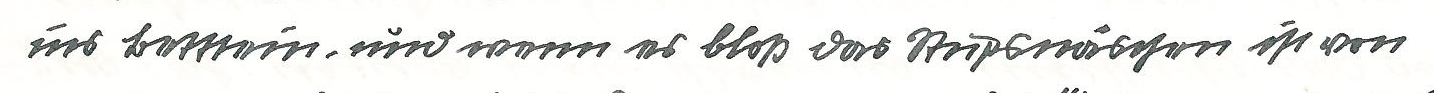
ins Bettlein, und wenn es bloß das Stupsnäschen ist von
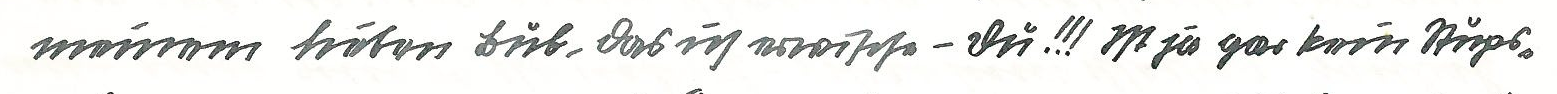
meinem lieben Bub, das ich erwische – Du!!! Ist ja gar kein Stups¬
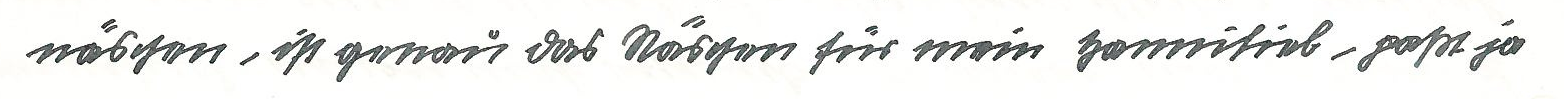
näschen, ist genau das Näschen für mein lieb, paßt ja
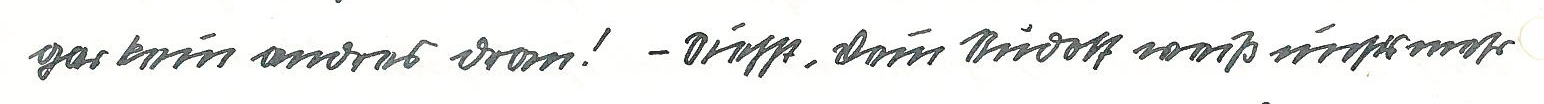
gar kein andres dran! – Siehst, Dein Rudolf weiß nichts mehr
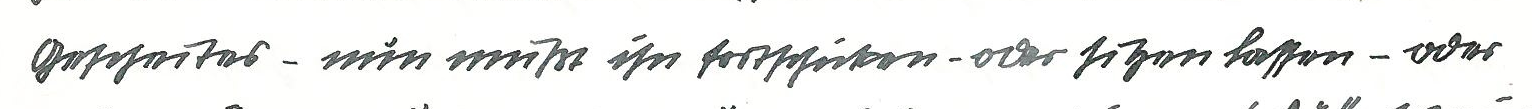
Gescheites – nun mußt ihn fortschicken – oder sitzen lassen – oder
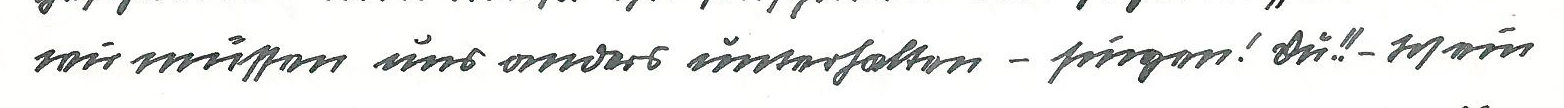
wir müssen uns anders unterhalten – singen! Du!! – Ich ein
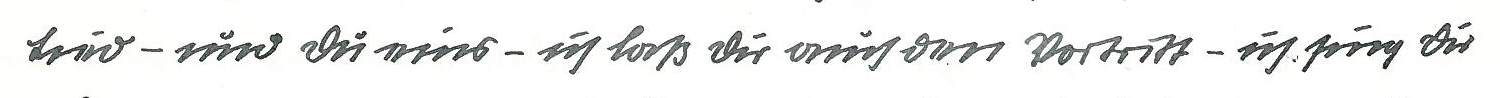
Lied – und Du eins – ich laß Dir auch den Vortritt – ich sing Dir
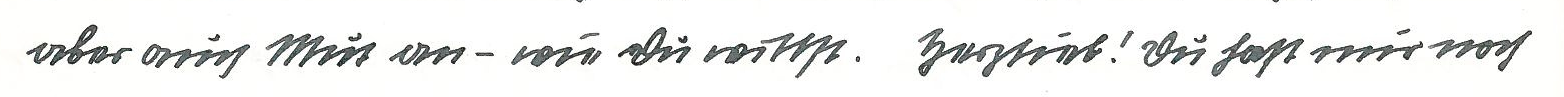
aber auch Mut an – wie Du willst. Herzlieb! Du hast mir noch
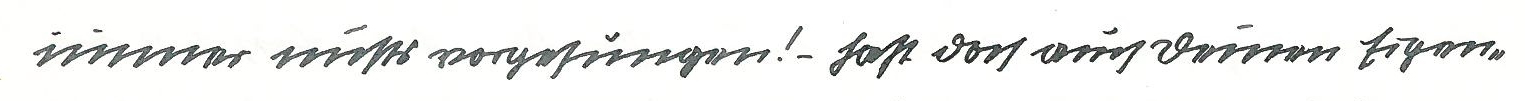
immer nichts vorgesungen! – Hast doch auch Deinen Eigen¬
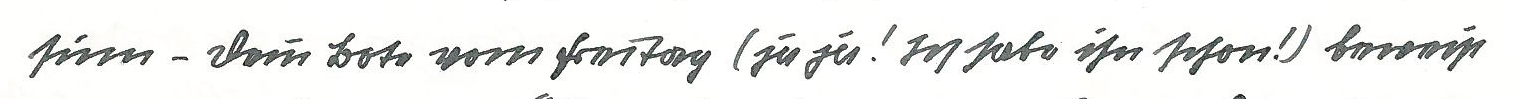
sinn – Dein Bote vom Freitag (ja ja! Ich habe ihn schon!) beweist
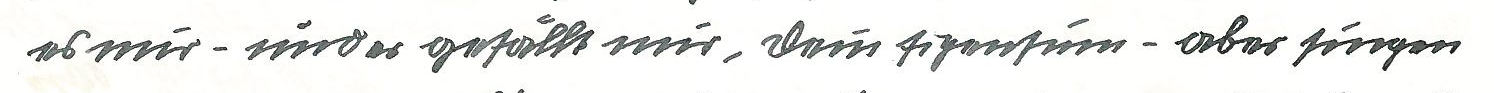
es mir – und er gefällt mir, Dein Eigensinn – aber singen
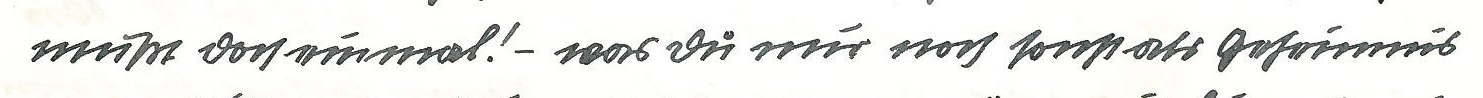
mußt doch einmal! – was Du mir noch sonst als Geheimnis
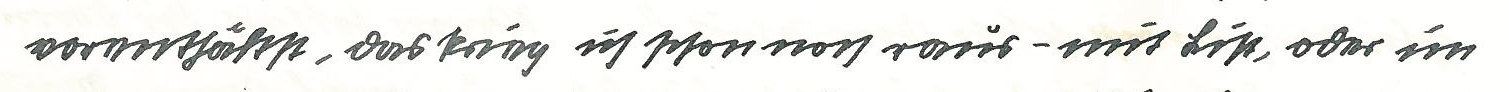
vorenthältst, das krieg ich schon noch raus – mit List, oder im
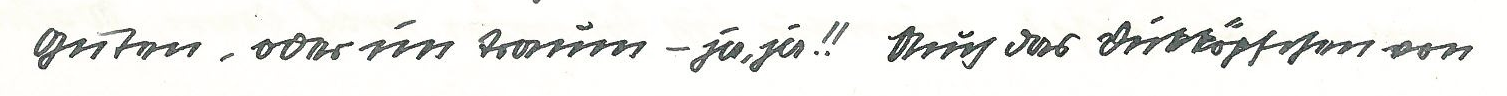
Guten, oder im Traum – ja, ja!! Auch das Dickköpfchen von
